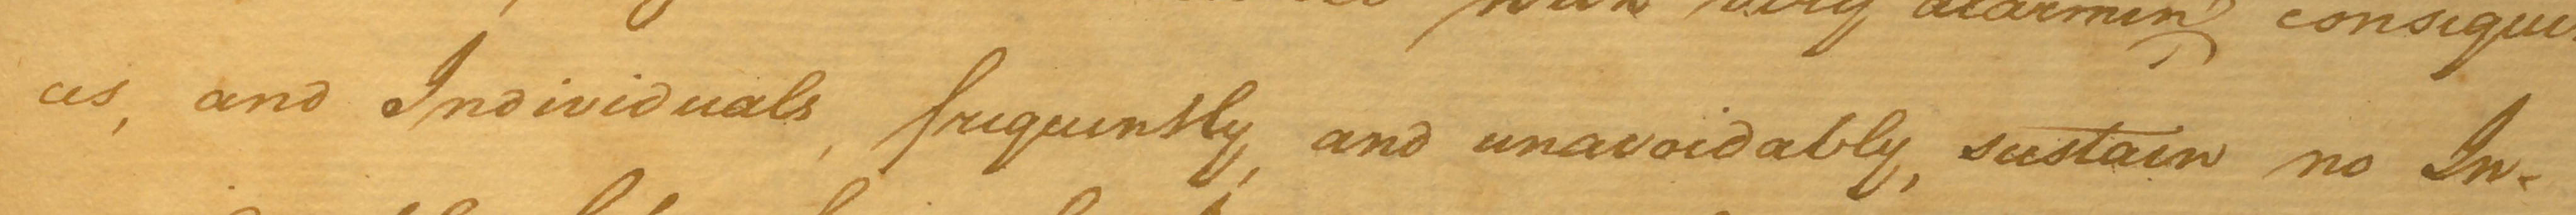ces, and Individuals frequently and unavoidably, sustain no In-
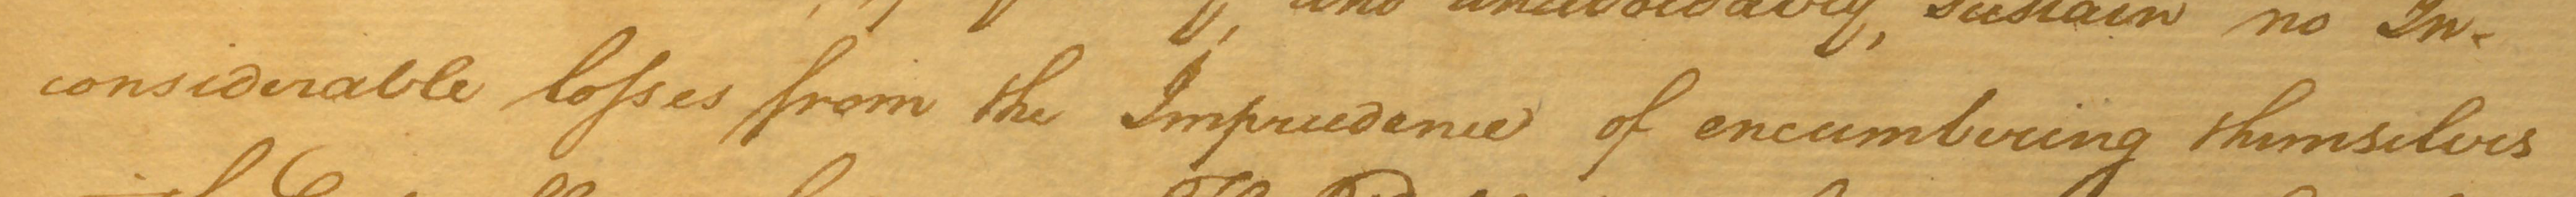considerable losses from the Imprudence of encumbering themselves
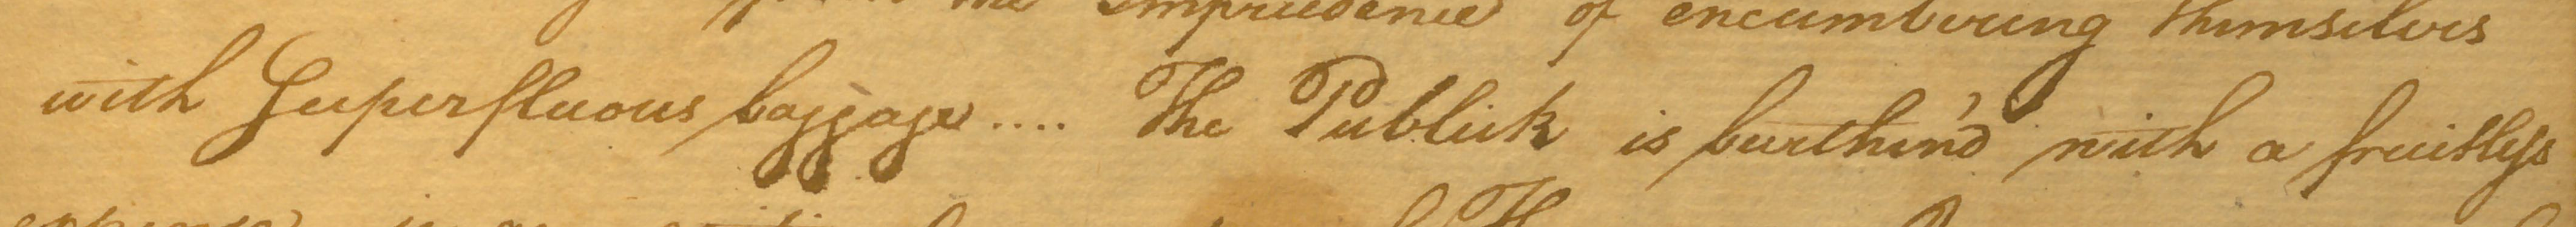with superfluous baggage.... The Publick is burthen'd with a fruitless
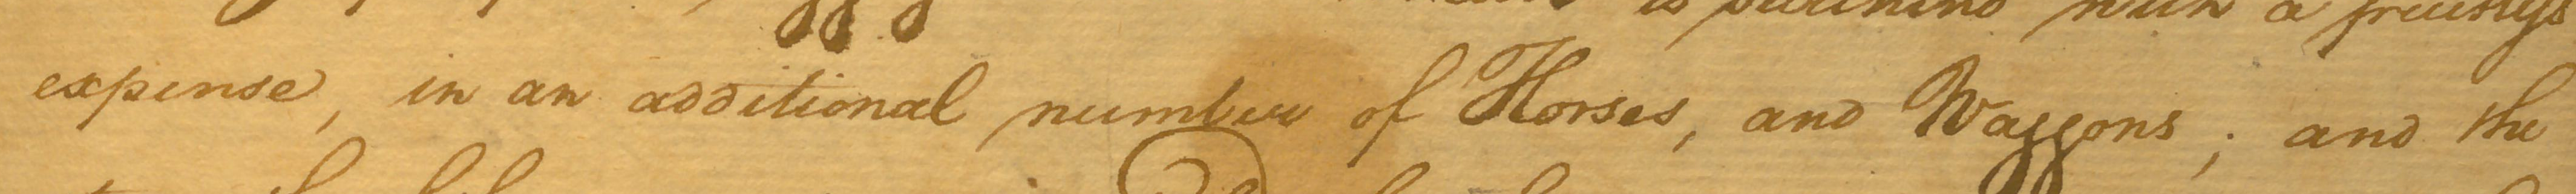expense, in an additional number of Horses, and Waggons; and the
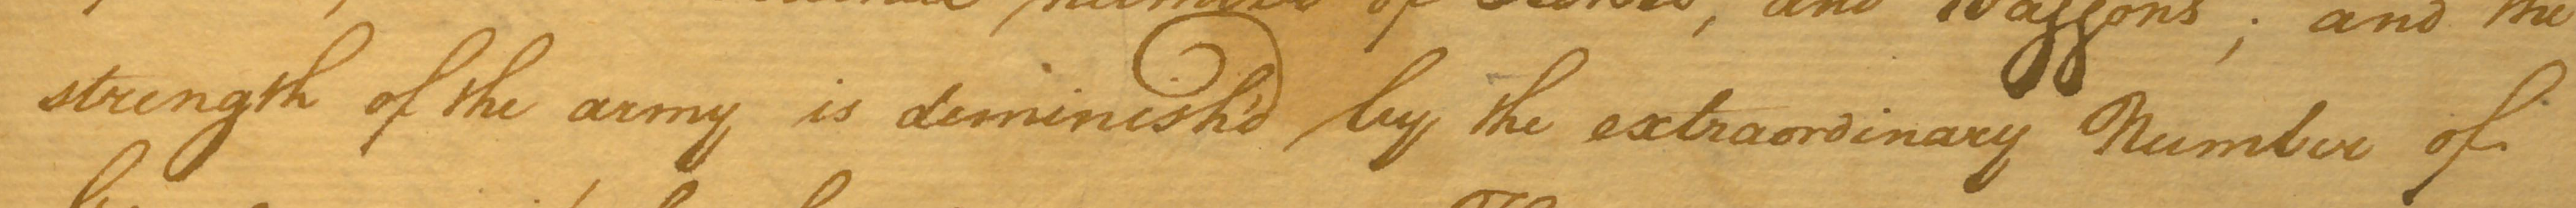strength of the army is diminish'd by the extraordinary Number of
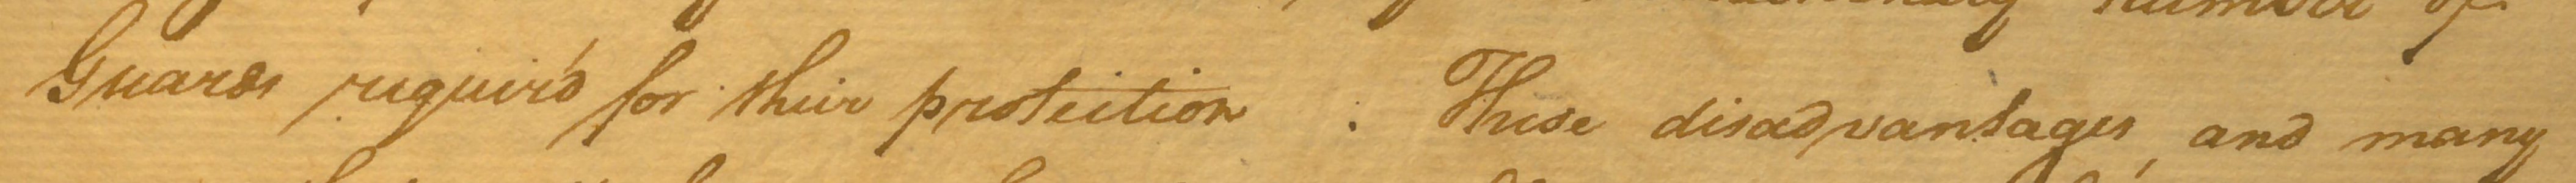Guards requir'd for their protection. These disadvantages, and many
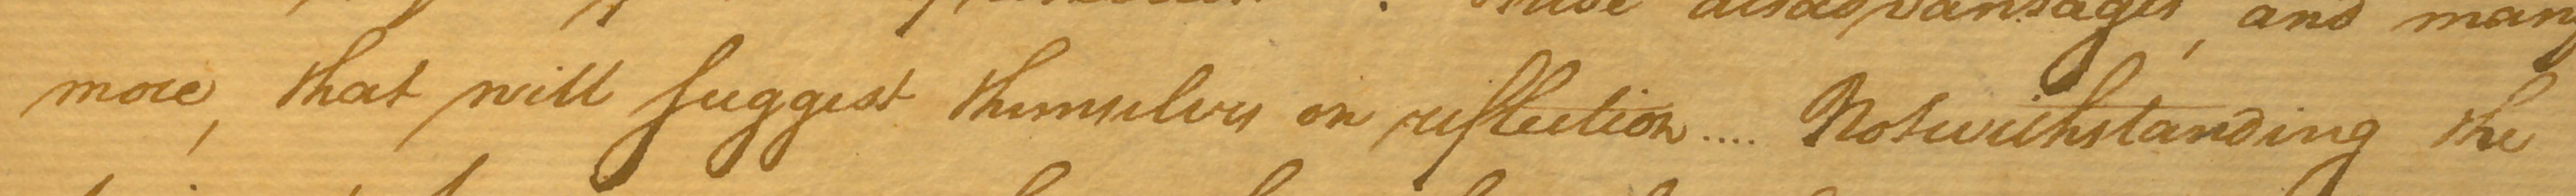more, that will suggest themselves on reflection.... Notwithstanding the
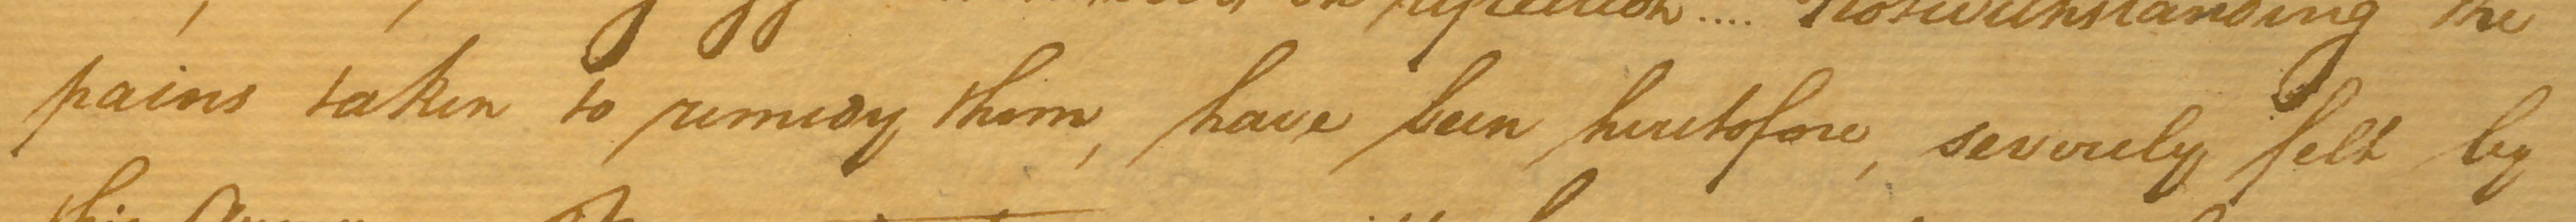pains taken to remedy them, have been heretofore severely felt by
